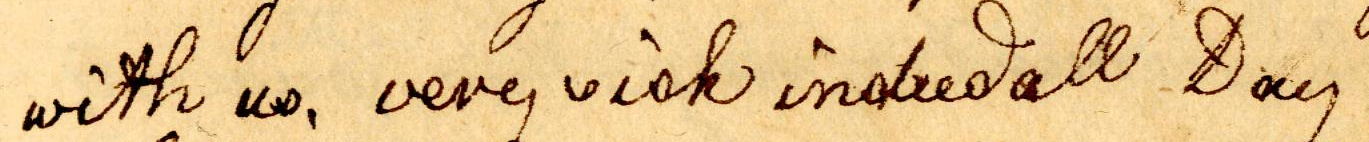with us, very sick indeed all Day
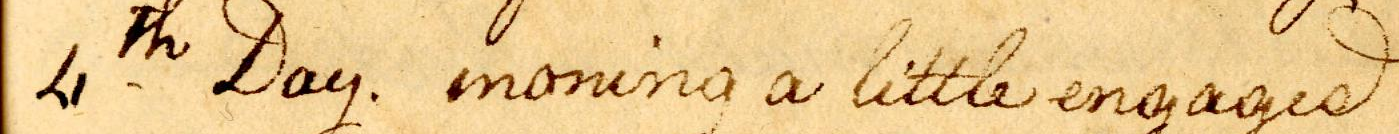4^th. Day. morning a little engaged
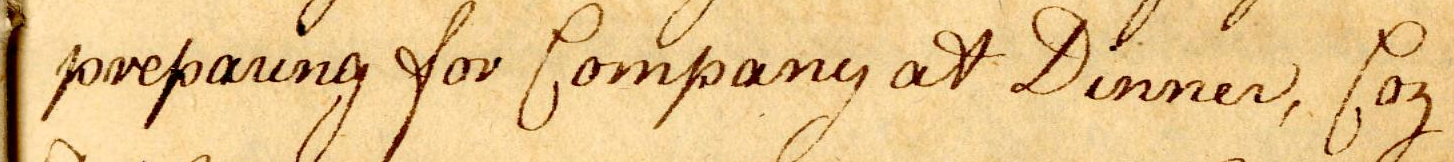preparing for Company at Dinner, Coz
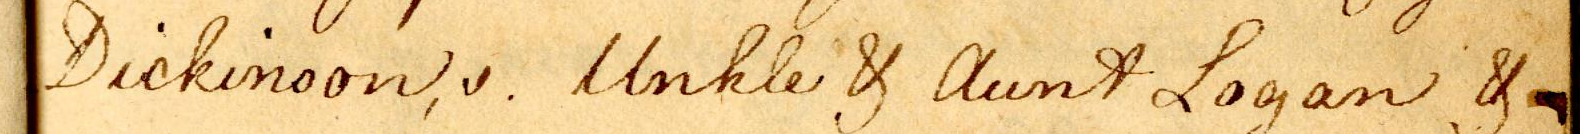Dickinsons. Unkle & Aunt Logan &
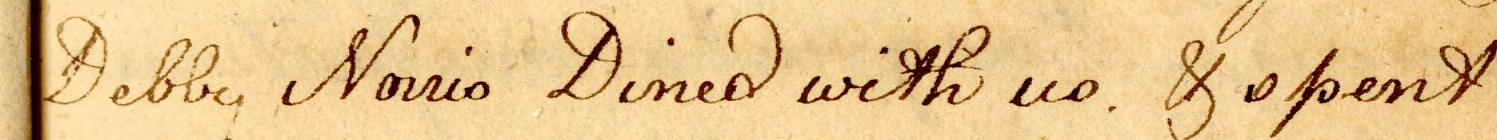Debby Norris Dined with us. & spent
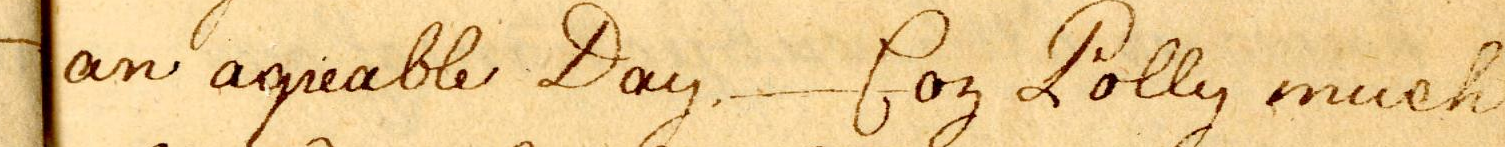an agreable Day- Coz Polly much
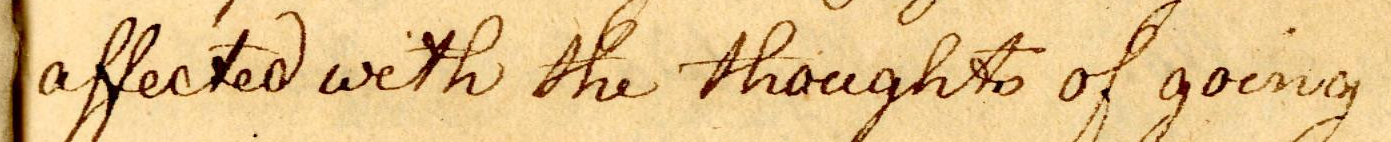affected with the thoughts of going
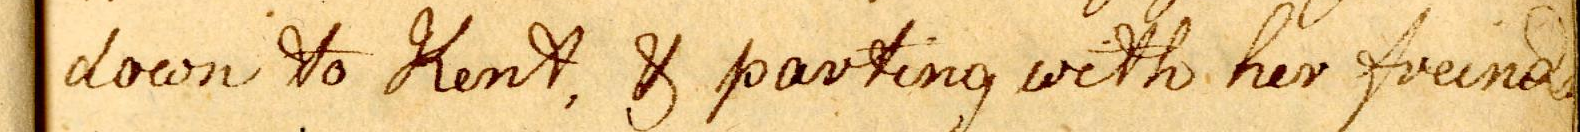down to Kent, & parting with her freind
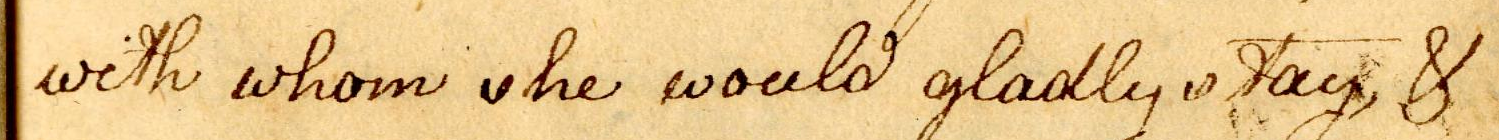with whom she would gladly stay, &
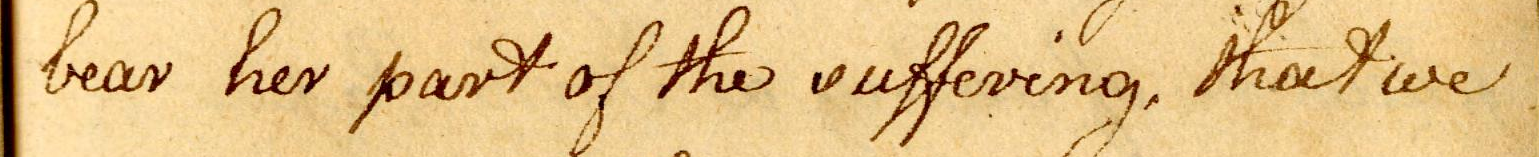bear her part of the suffering, that we
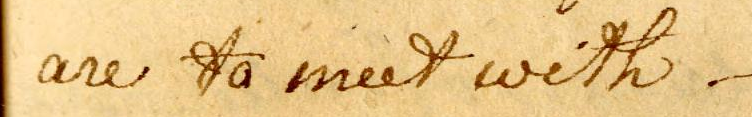are to meet with -
